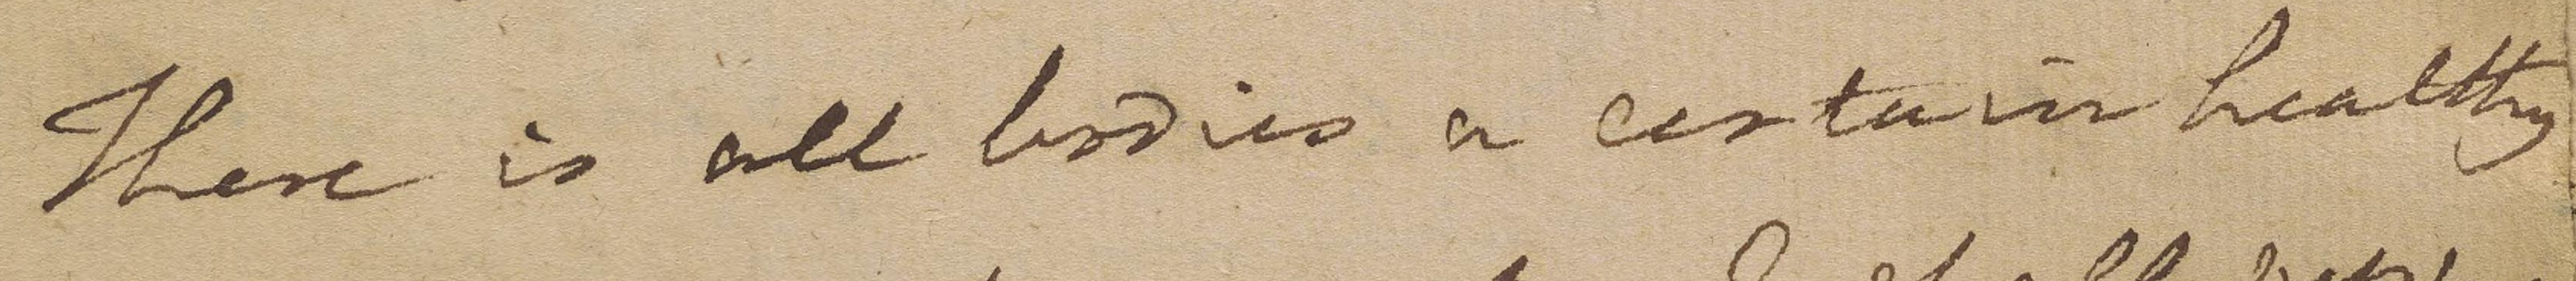There is all bodies a certain healthy
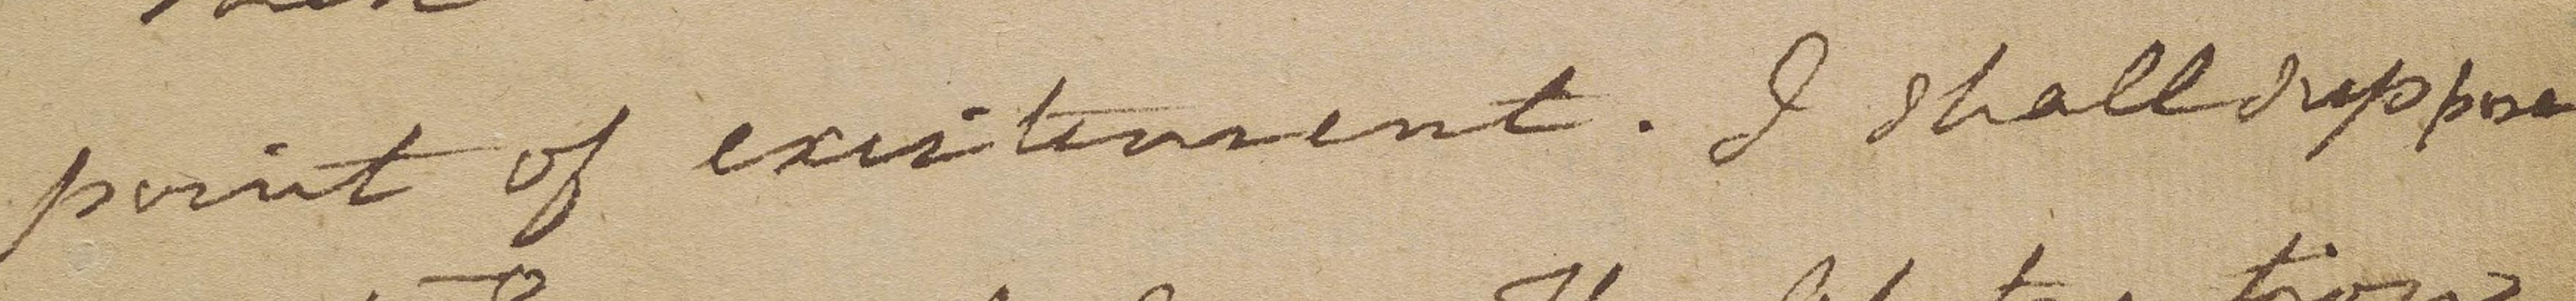point of excitement. I shall suppose
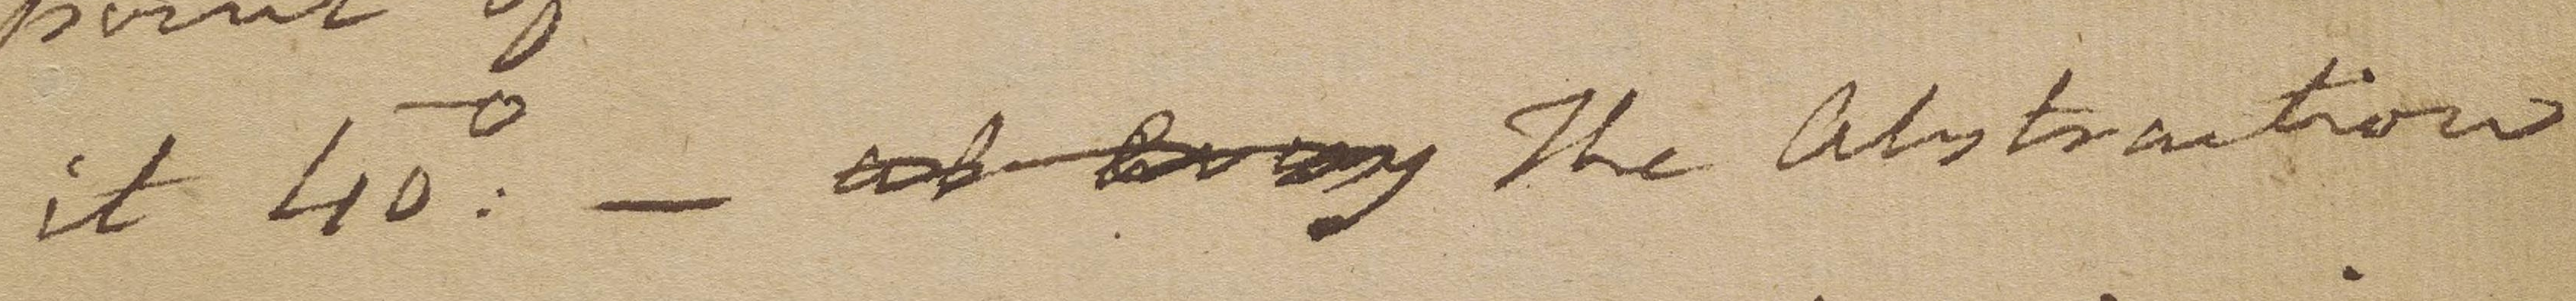it 40^° - The abstraction
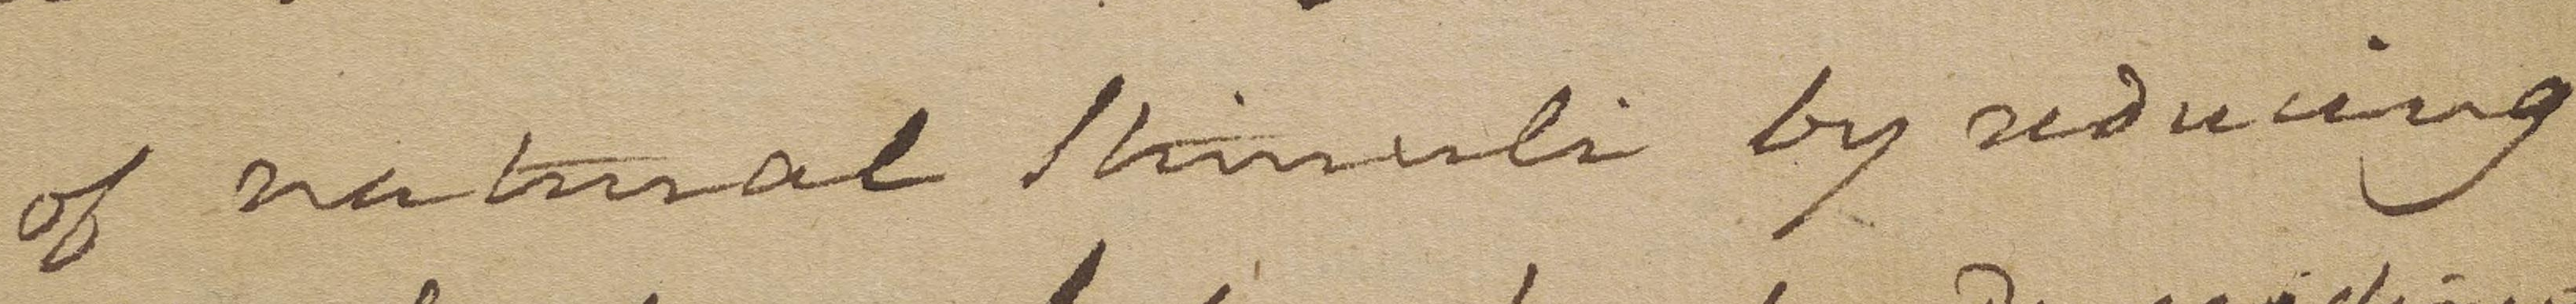of natural stimuli by reducing
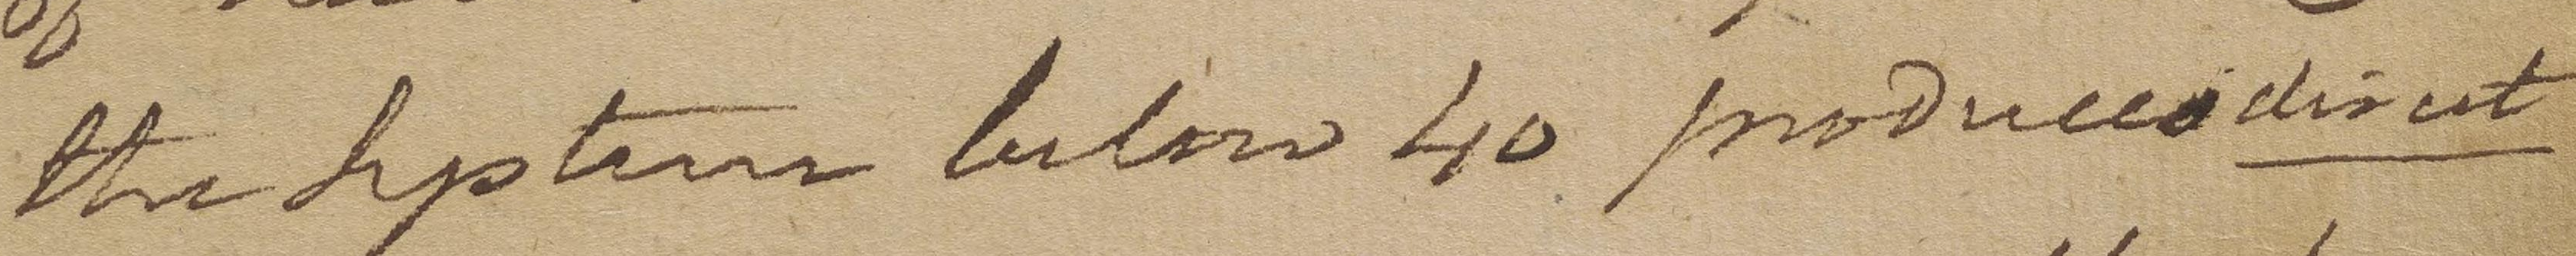the system below 40 produces direct
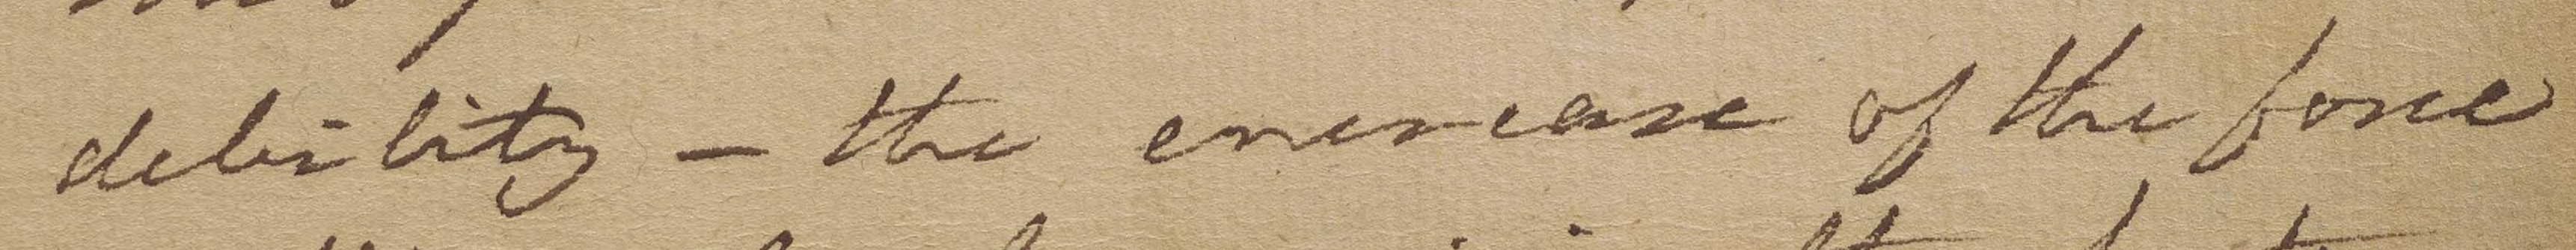debility, the exercise of the force
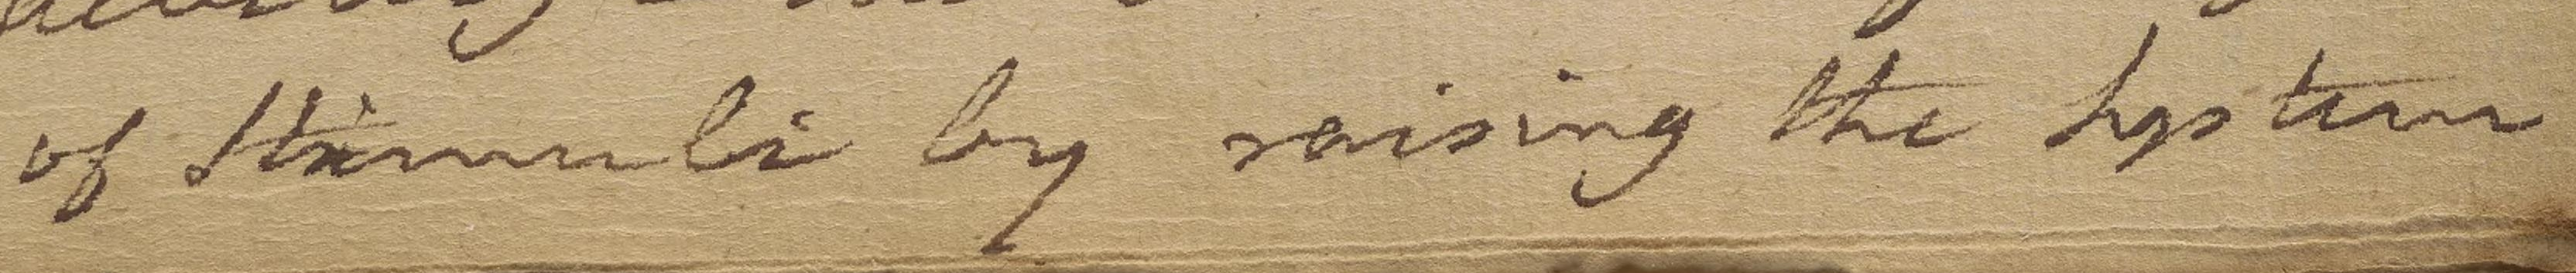of stimuli by raising the system
